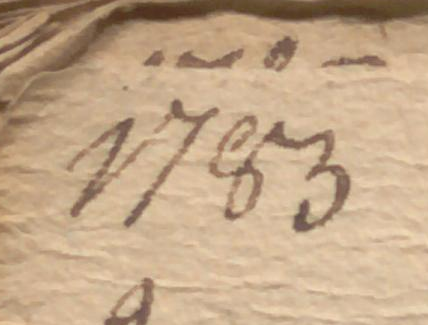1783
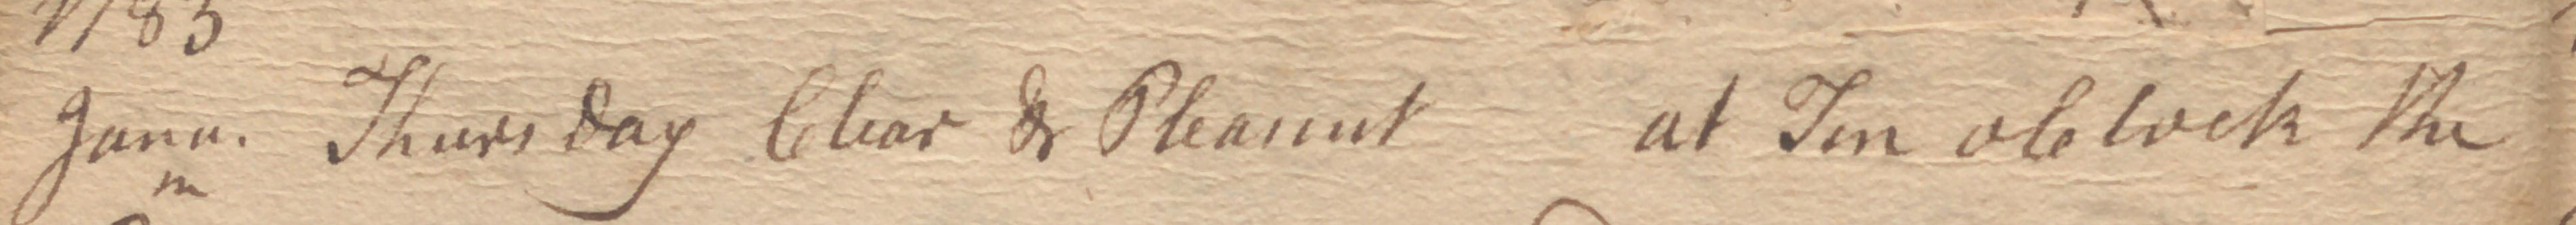Janu. Thursday Clear & Pleasent at Ten oClock the
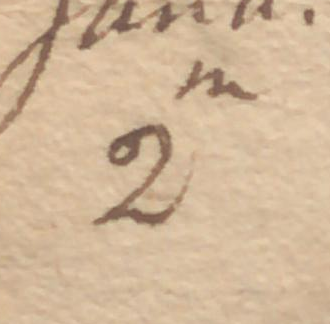2^th
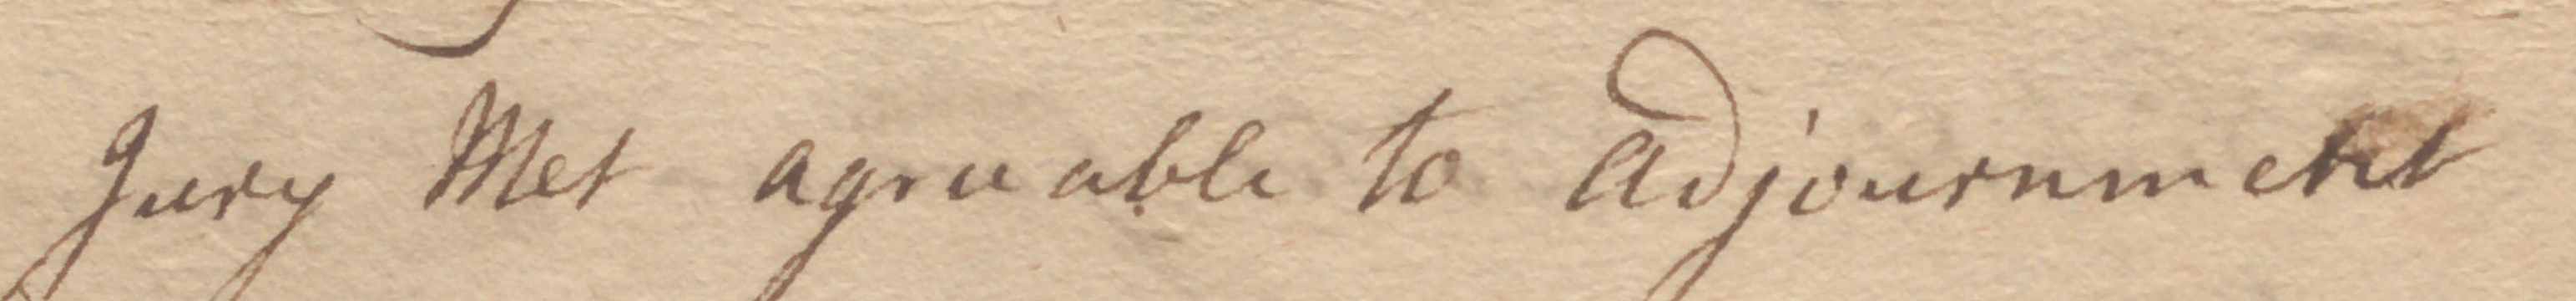Jury Met agreeable to Adjournment
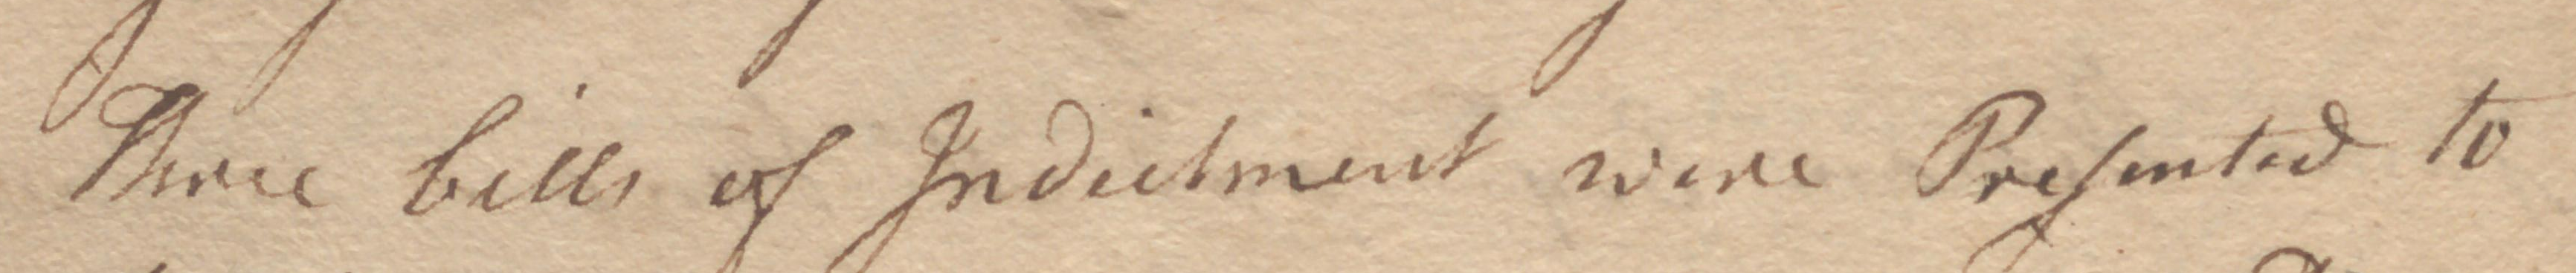Three bells of Indietment were Presented to
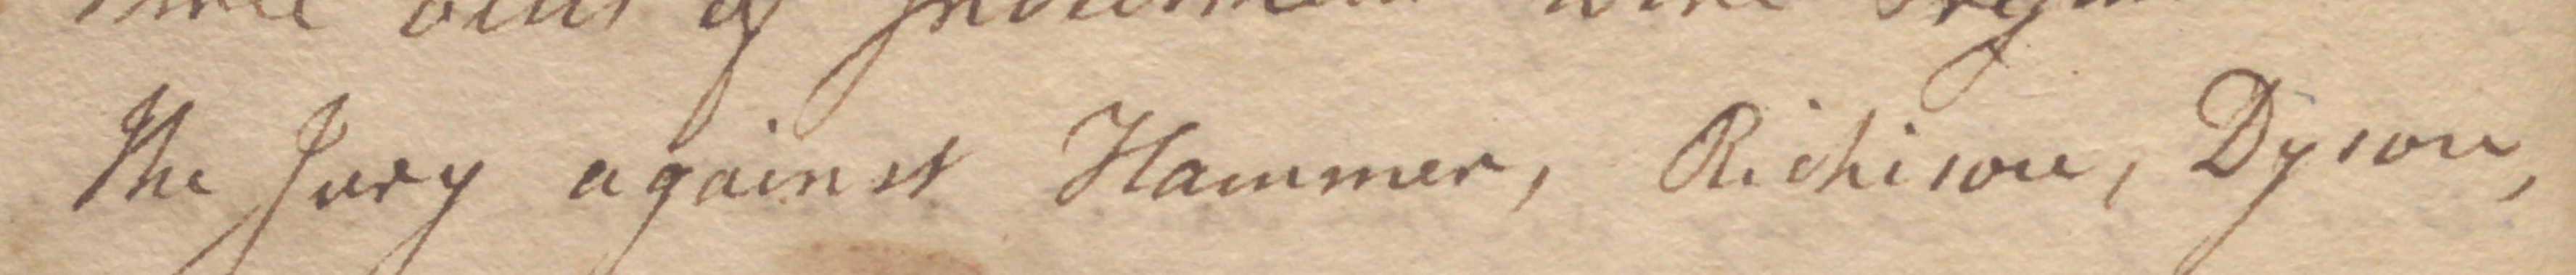the Jury against Hammer, Richison, Dyson
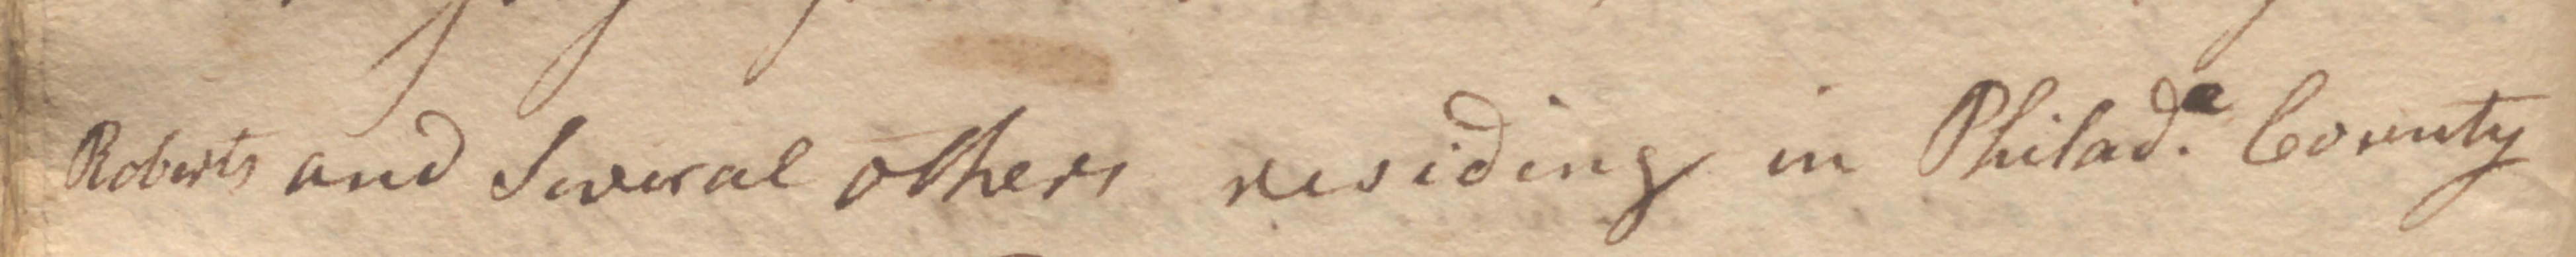Roberts and Several others residing in Philad^a. County
